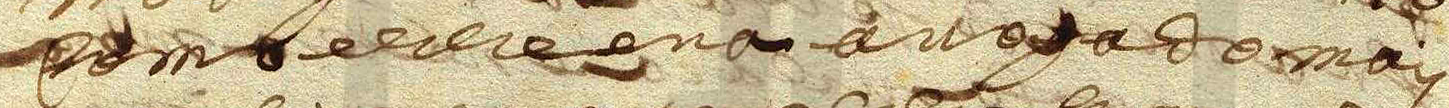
Como elle era auogado mais
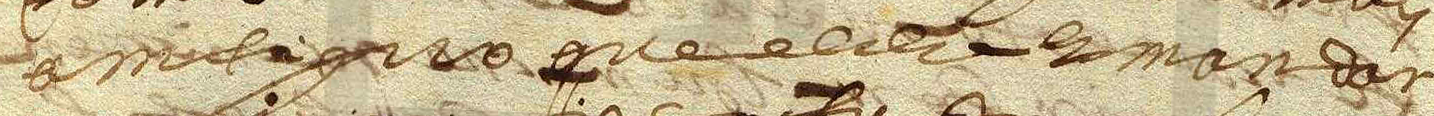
amtiguo que elle E mandar
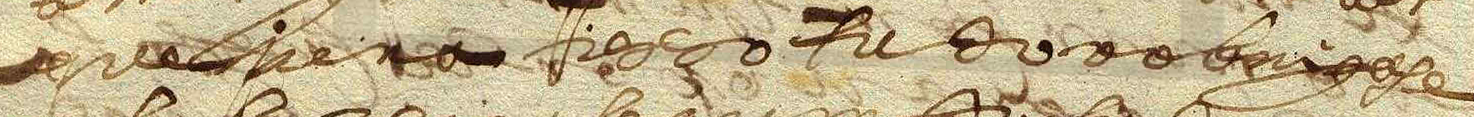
que pera isso tudo o obrigase
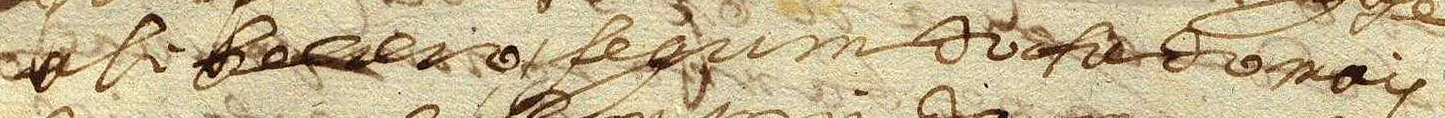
a libello segumdo tudo mais
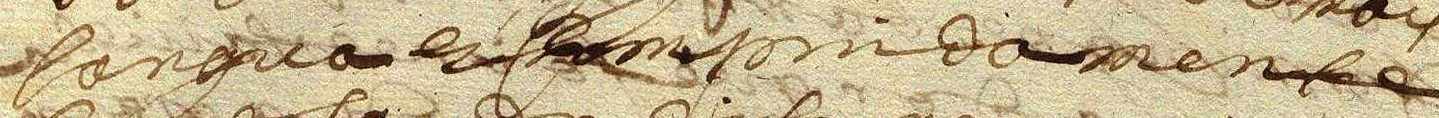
longua E Compridamente
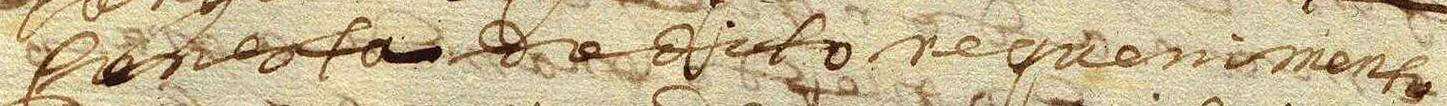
Consta do dito requerimento
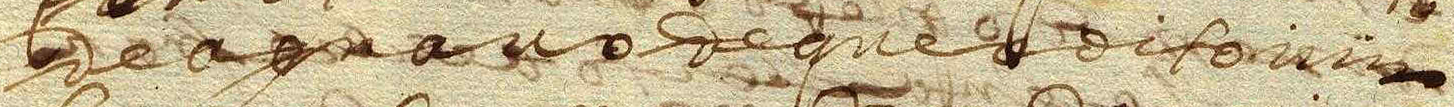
de agrauo de que o dito iuiz
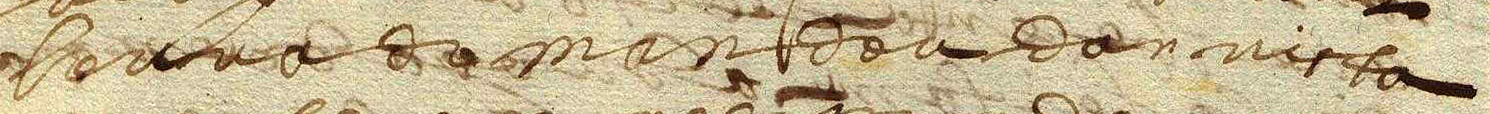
louuado mandou dar uista
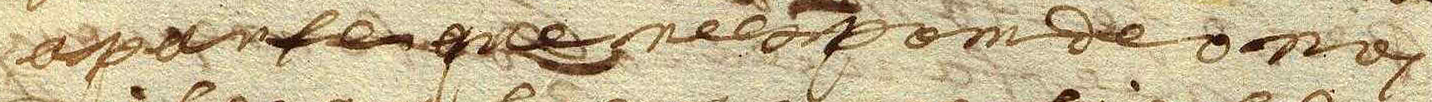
a parte que respomdeo nos
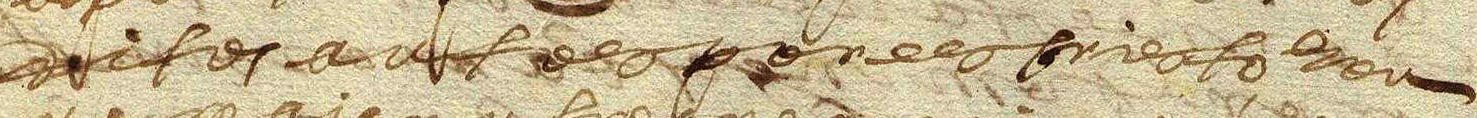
ditos autos por escristo, E ou
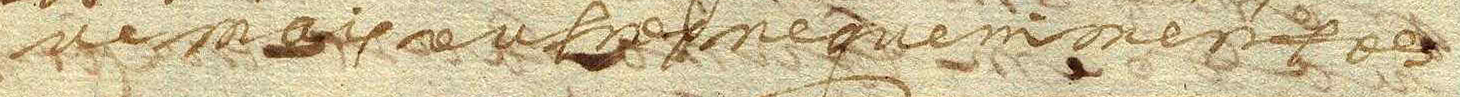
ue mais outros requerimentos
